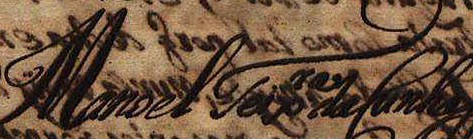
Manoel Teix.ra da Cunha
